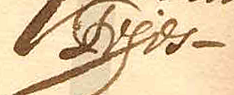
Fojos -
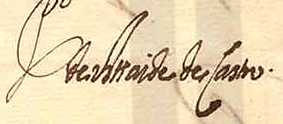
Po de Attaide de Castro.
